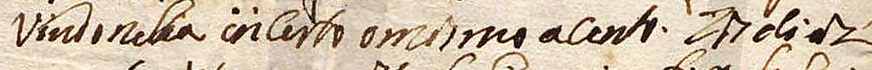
vindo nella inCerto o mesmo acento. E os diaz
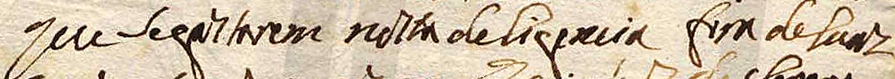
que se gastarem nesta deligencia fora de suaz
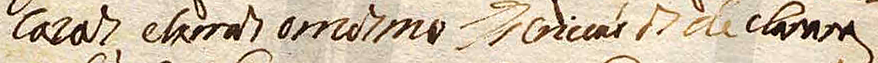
cazas e terras o mesmo Escriuaõ declarara
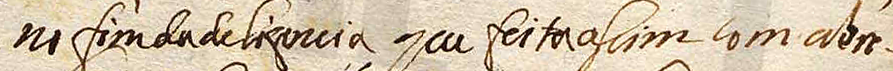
no fim da deligencia, que feita asim com a bre
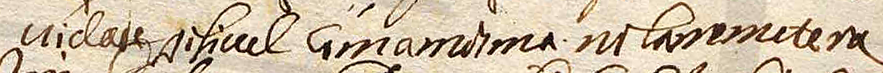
uidade possiuel com a mesma no la rremetera
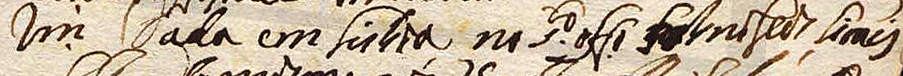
vm Dada em Lisboa no s.to off.o sob nossos sinais
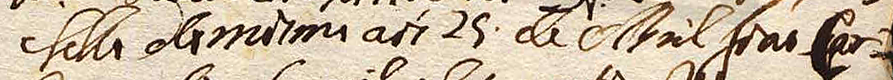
e sello do mesmo áos 25. de Abril Joaõ Car
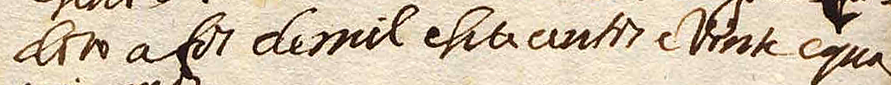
dozo a fis de mil e setecentos e Vinte e qua
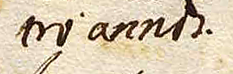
tro annos.
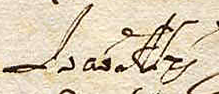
Ioaõ Alz̄s
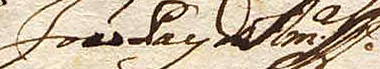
João Paes de Alm.a
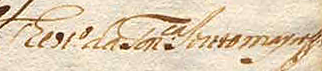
Theot.o da Fon.ca Santomayor
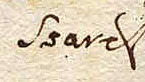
Soares
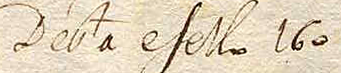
Desta e sello 160
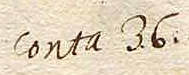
conta 36.
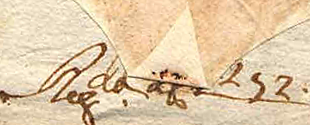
Regda 252.
